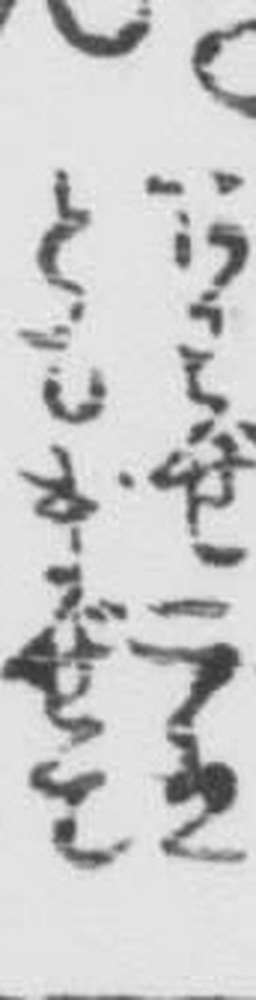ともまぜて
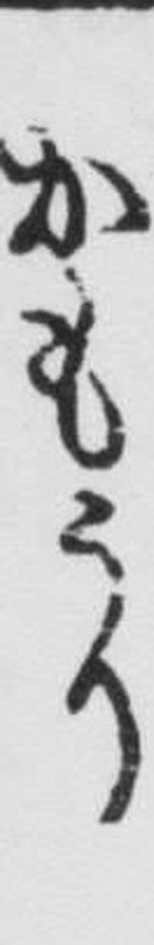かもうり
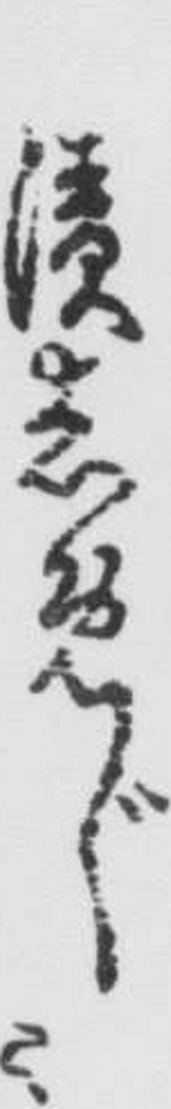漬しめじ
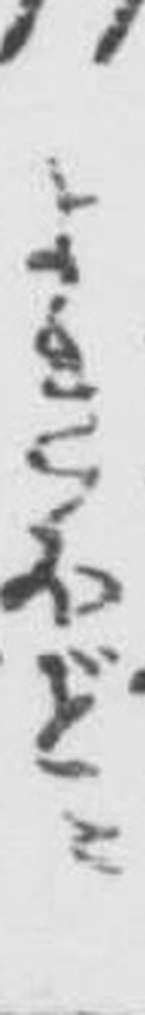よきほどに
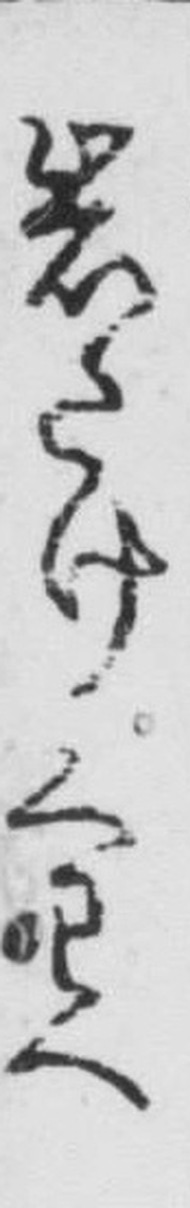岩たけくわへ
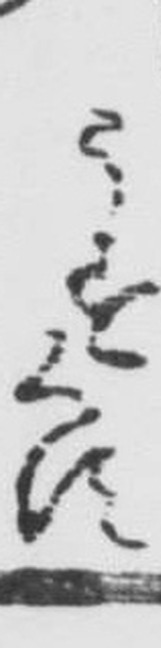うすくず
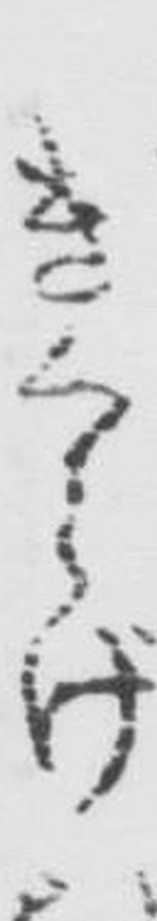きくらげ
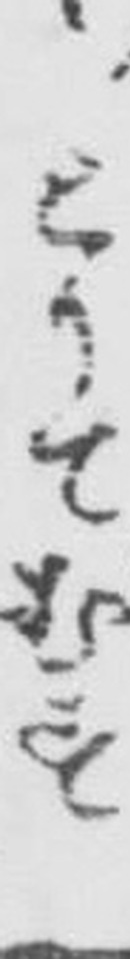とりてむす
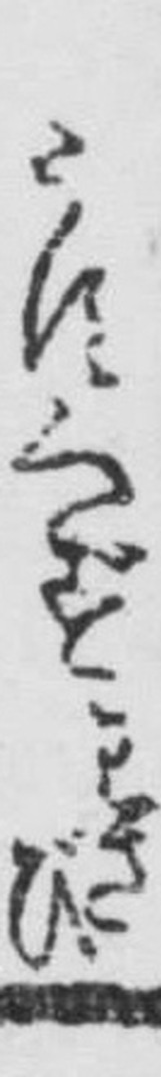うすくずわさび
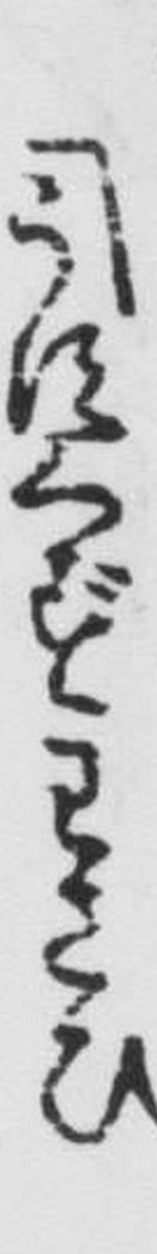〽うすくずわさひ
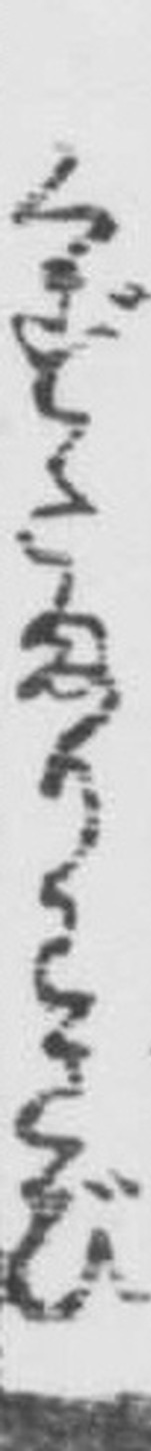くずたまりわさび
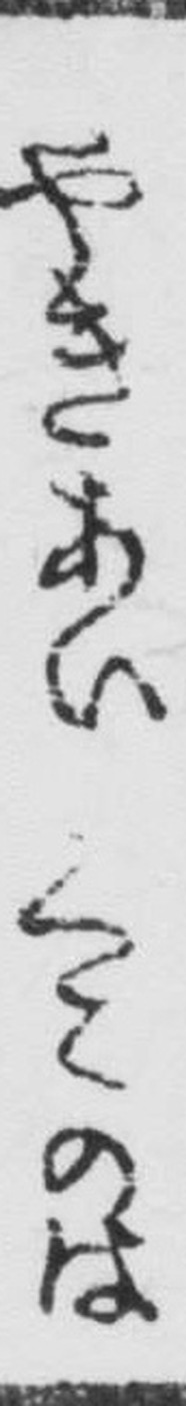やきあいくこのは
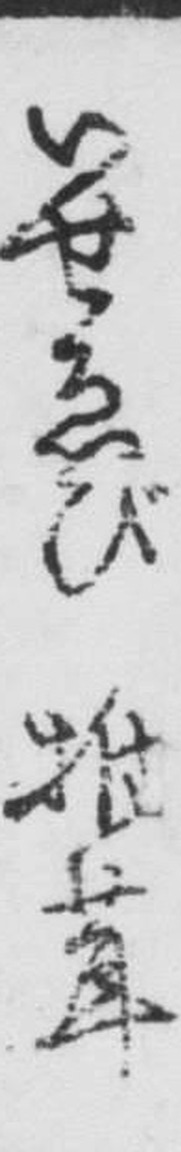いせゑび椎茸
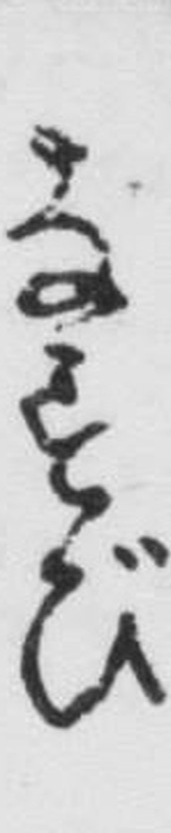なすび
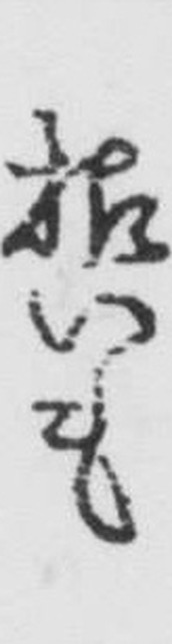根いも
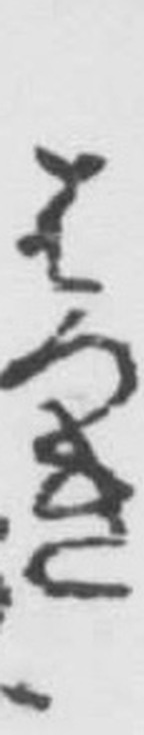はつき
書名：諸家通用/即席料理
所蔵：大阪府立大学学術情報センター 国文学研究資料館
